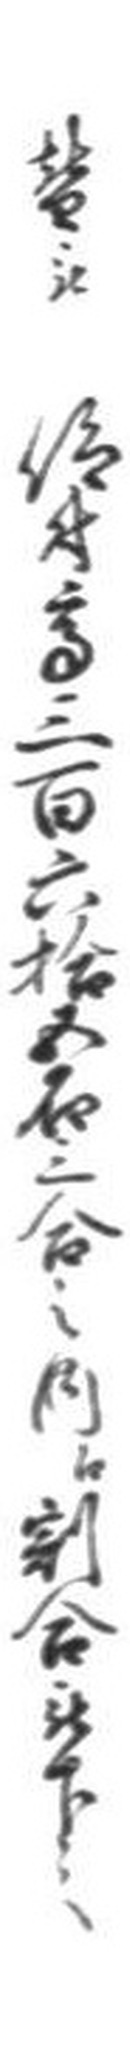替被仰付高三百六拾五石三合之内江割合被下之
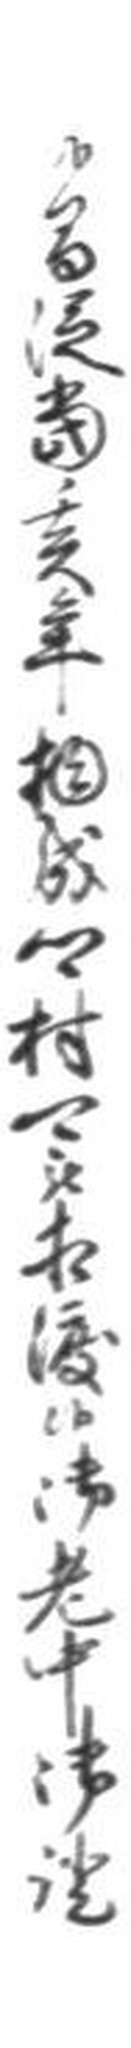候旨従当亥年物成郷村可被相渡候御老中御証
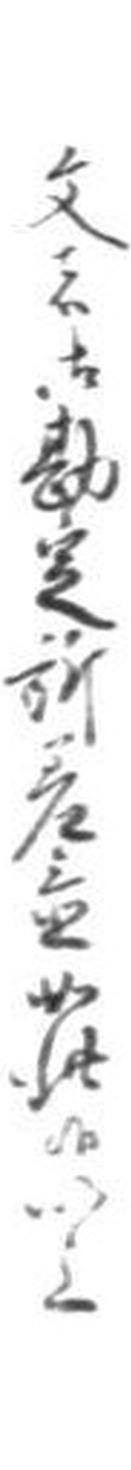文者御勘定所差置如此候以上
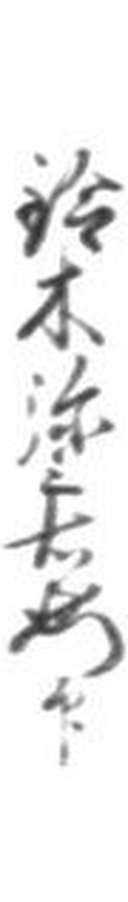正木藤右衛門印
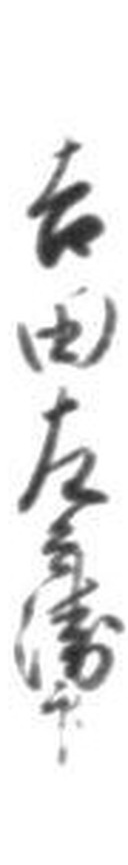吉田左兵衛印
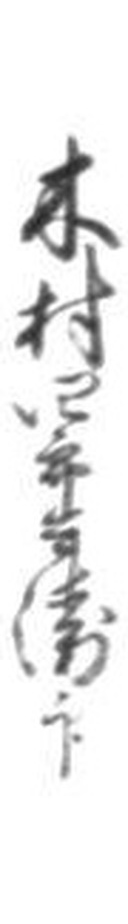木村四郎兵衛印
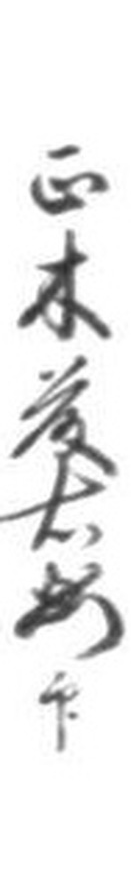正木藤右衛門印

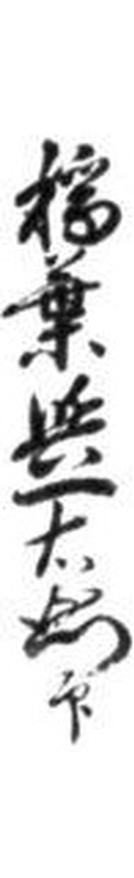稲葉与一右衛門印
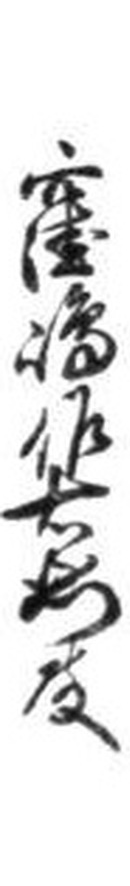窪嶋作右衛門殿
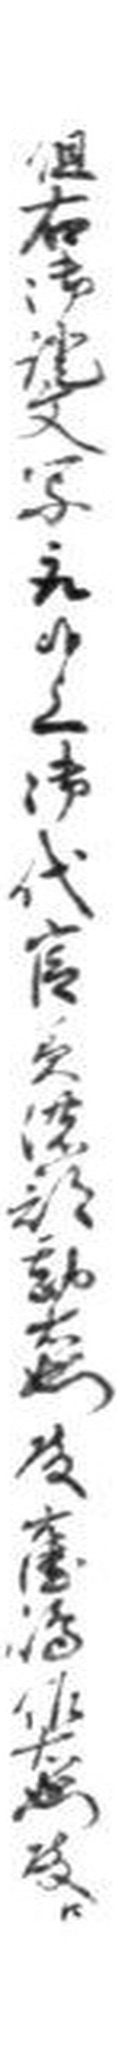但右御証文写取候上御代官美濃部勘右衛門殿窪嶋作右衛門殿江
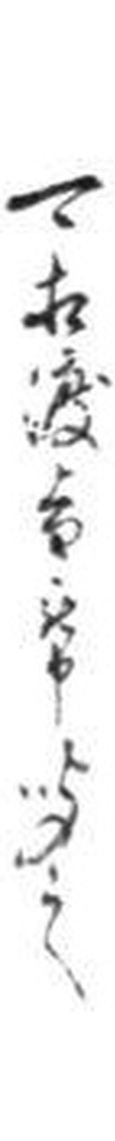可相渡旨被申聞之
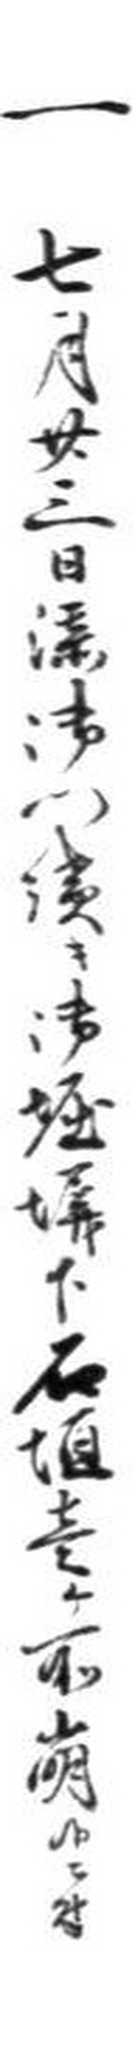一七月廿三日漆御門続キ御堀塀下石垣壱ケ所崩候ニ付
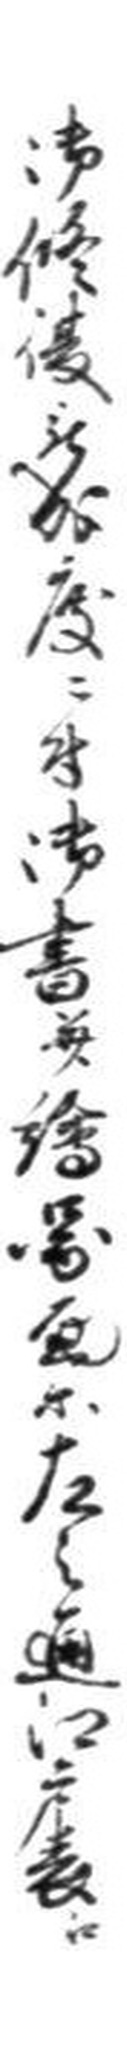御修復被成度ニ付御書并絵図面等左之通江戸表江
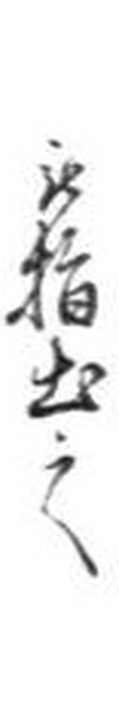被指出之
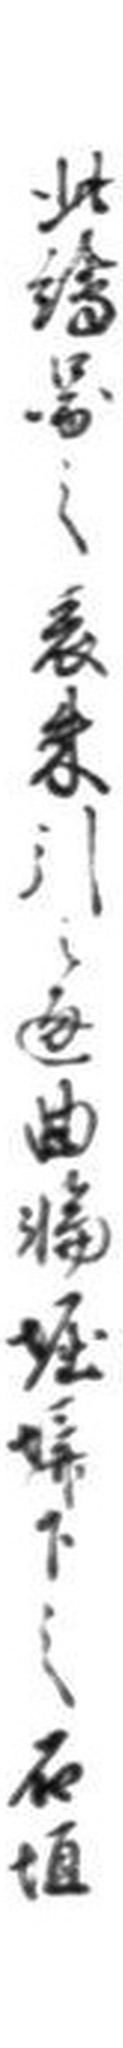此絵図之表朱引之通曲輪堀塀下之石垣
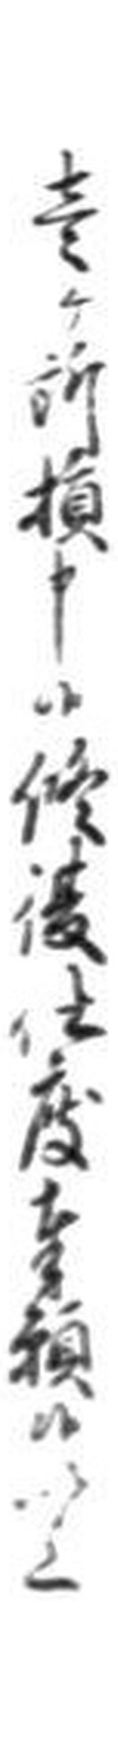壱ケ所損申候修復仕度奉願候以上
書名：家譜 三十三 吉邦公 享保四年
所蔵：福井県文書館 Fukui Prefectural Archives
